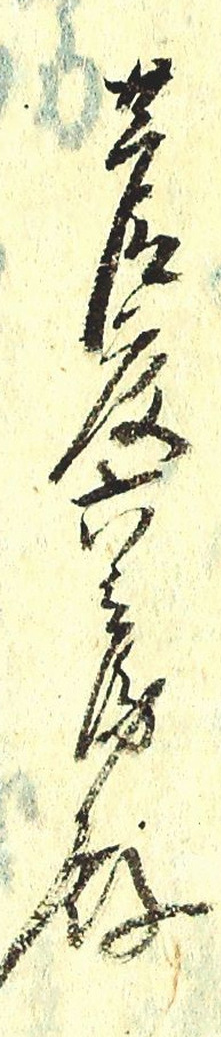菅藤六兵衛殿

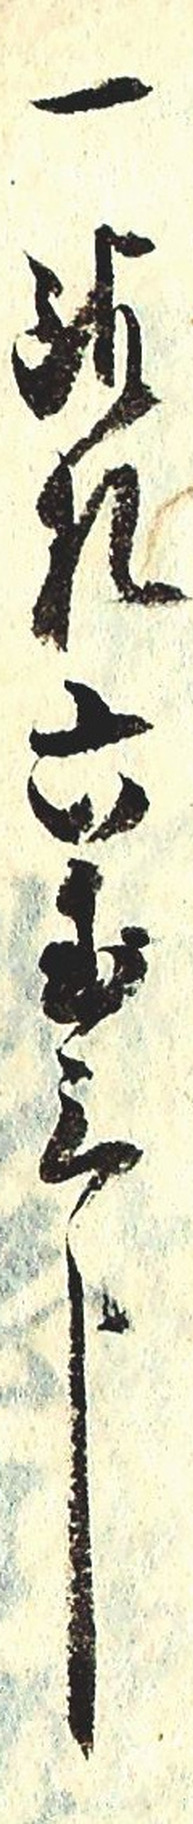一銀札六匁三分
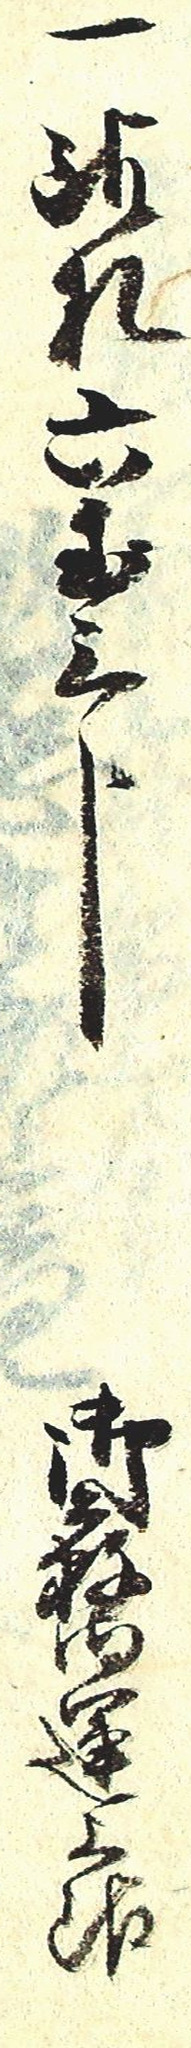一銀札六匁三分御藪御運上銀
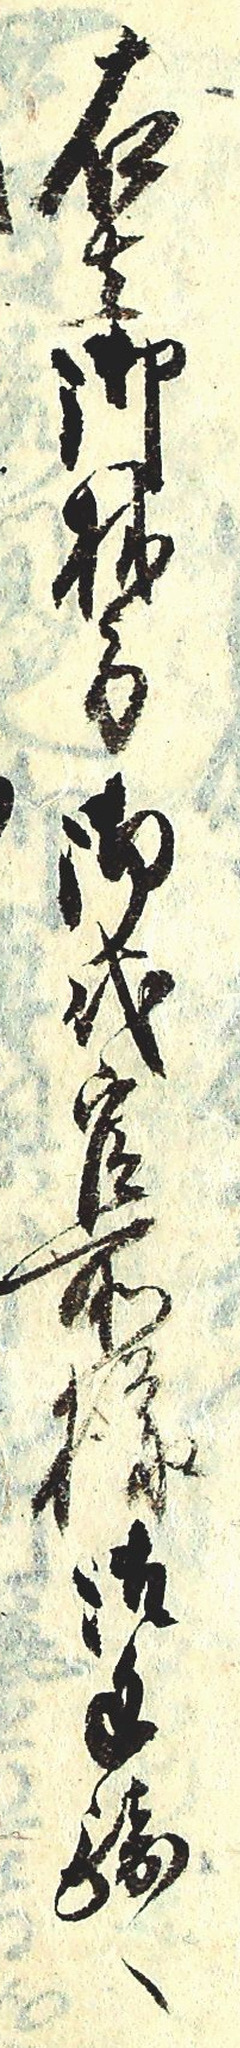右は御林方御代官所様御手崎へ
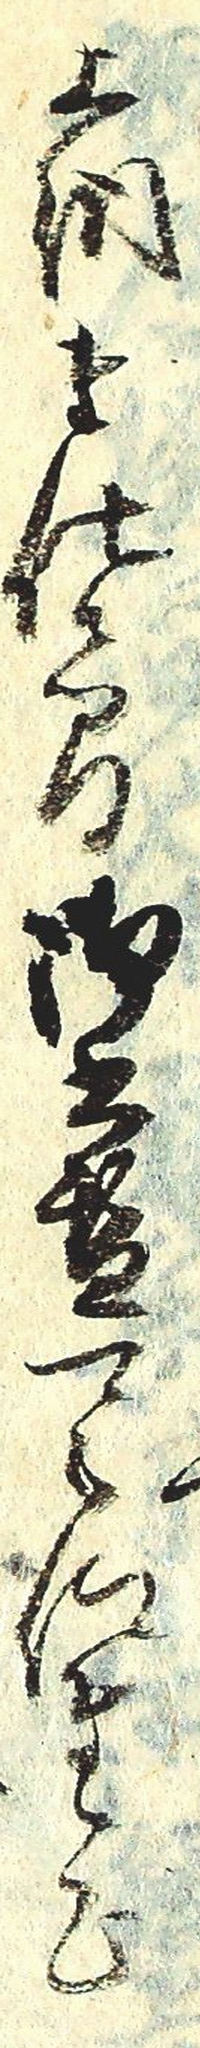上納奉仕候間御書替可被仰付候以上
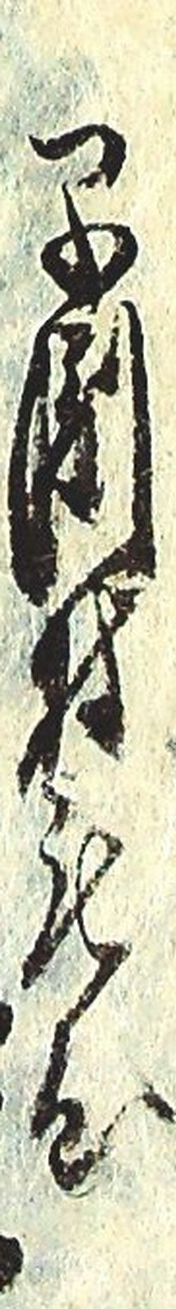早渕村庄屋
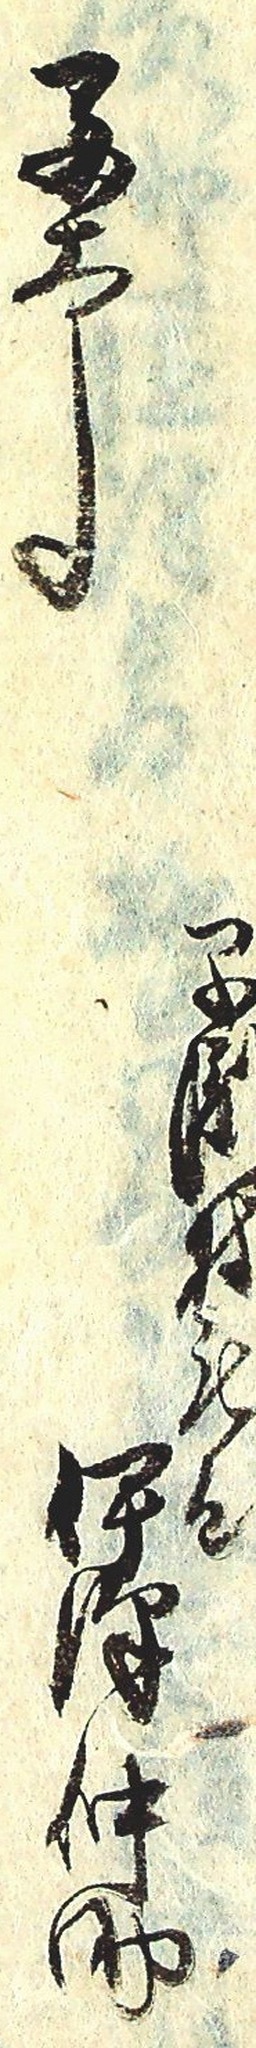子十一月伊沢仲助
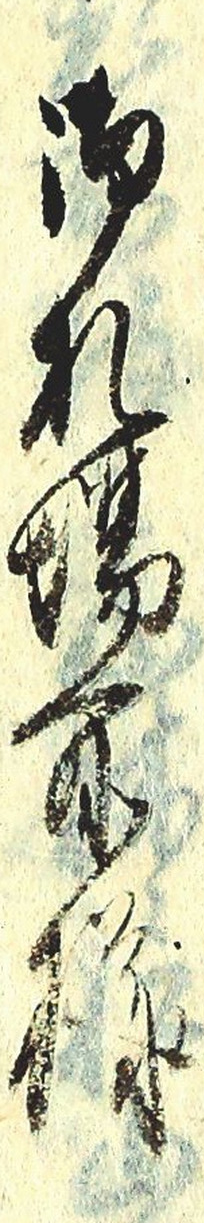御札場所様
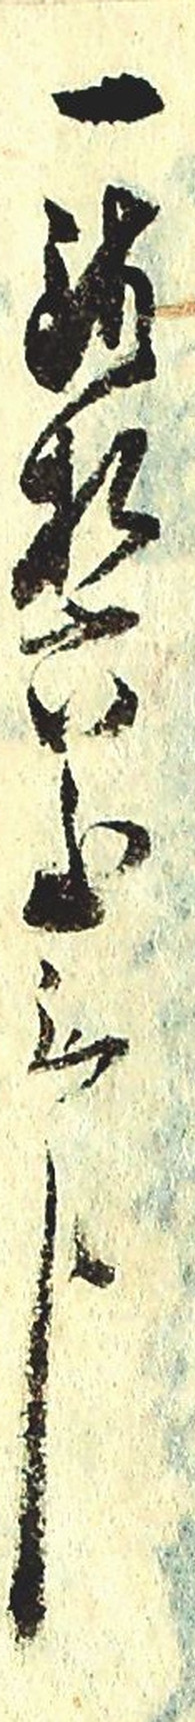一銀札六匁三分
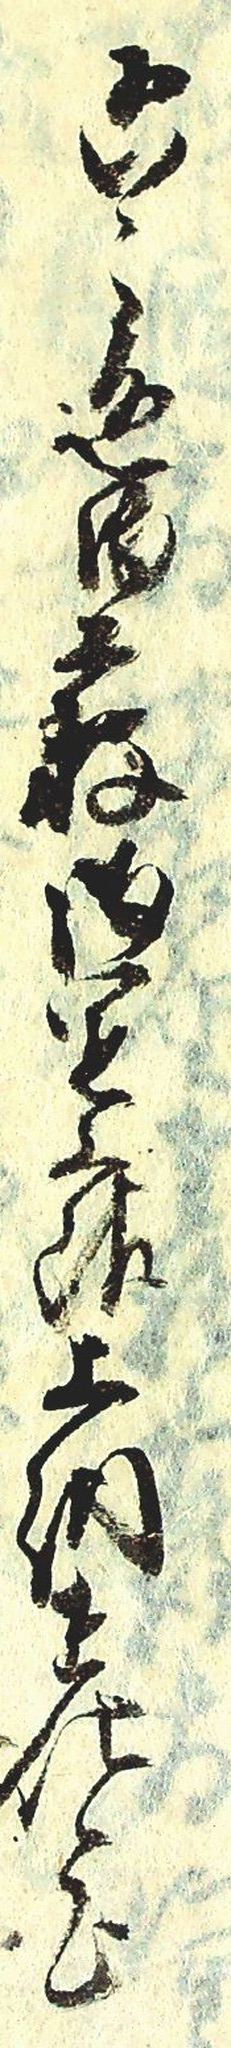右之通御藪御運上銀上納奉仕候以上
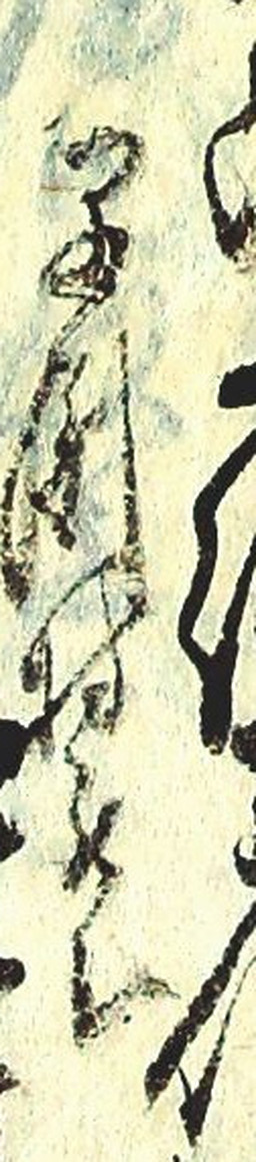早渕村庄屋
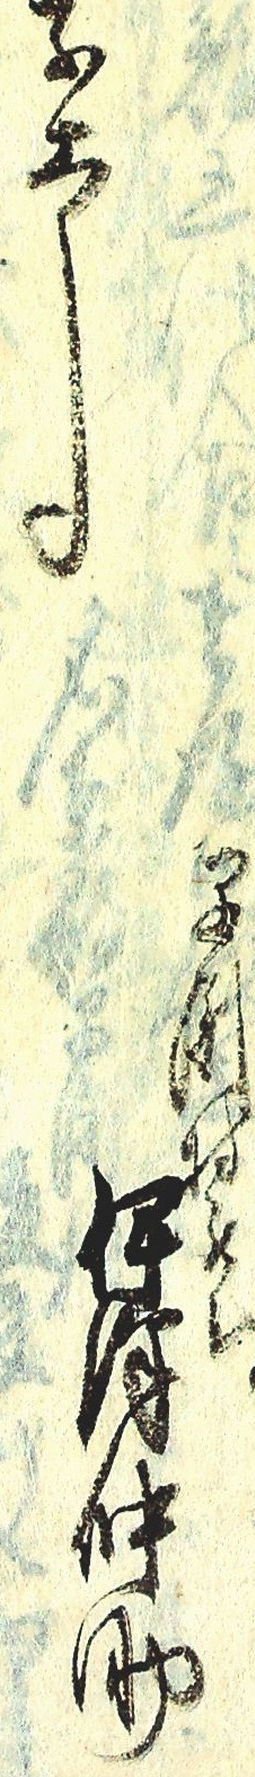子十一月伊沢仲助
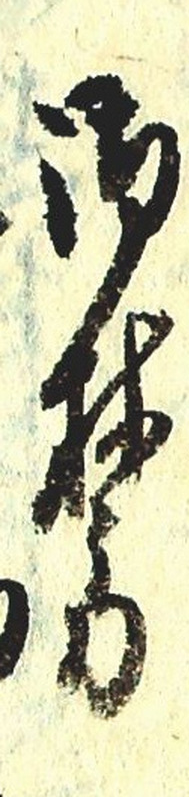御林方
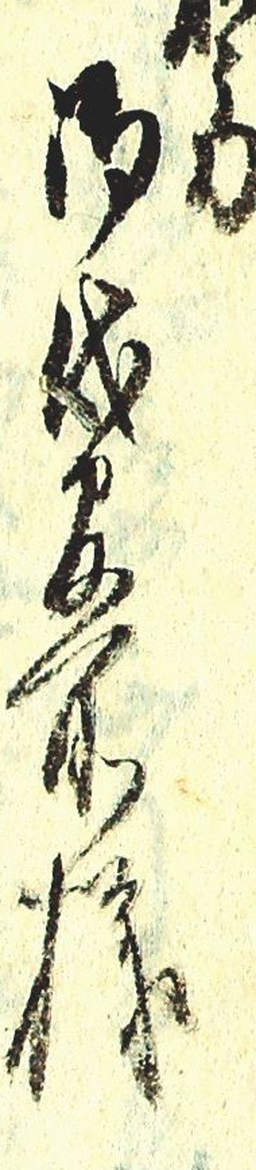御代官所様

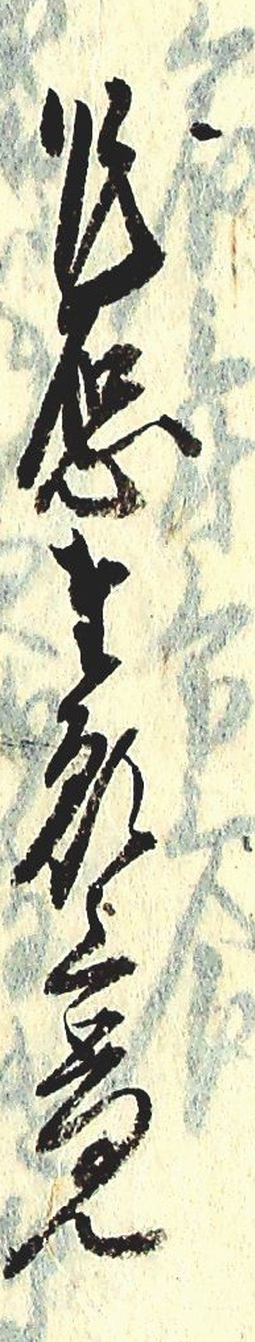乍恐奉願上覚
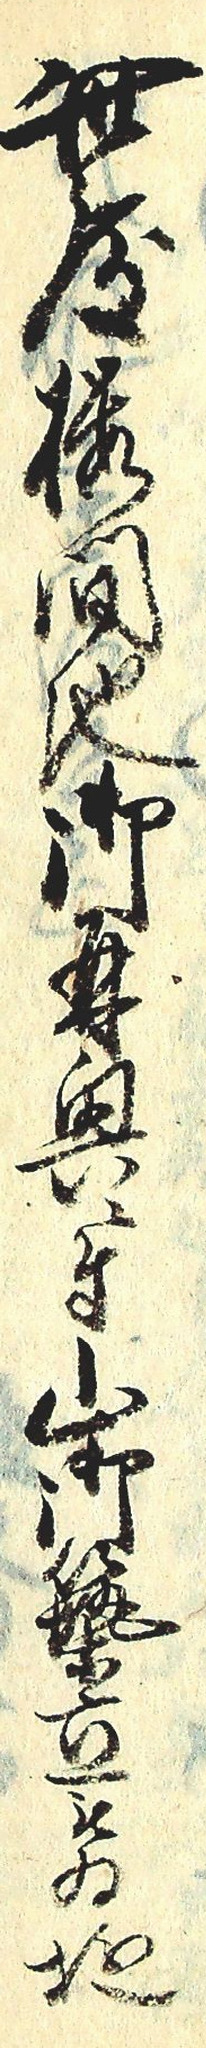此度桜間池御再興に付山御築立被為遊
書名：諸御願書控(弐番）
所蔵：鳴門教育大学 Naruto University of Education
